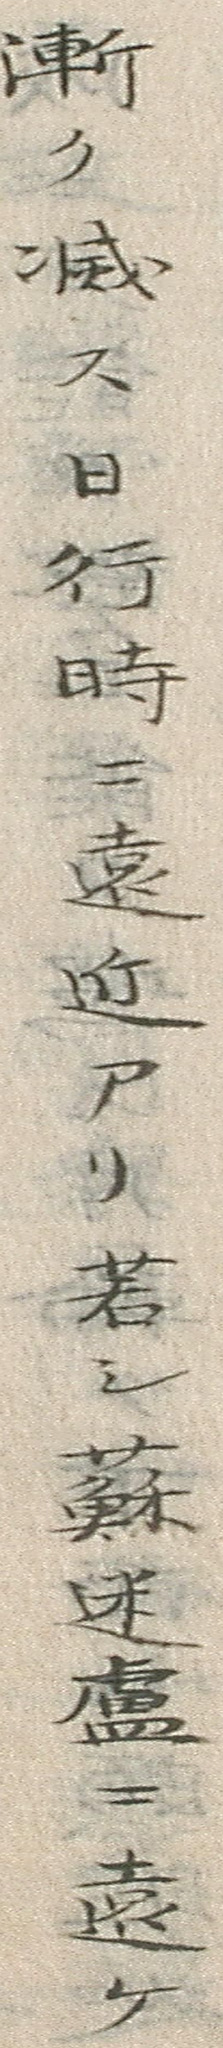漸ク滅ス日行時ニ遠近アリ若シ蘇迷慮ニ遠ケ
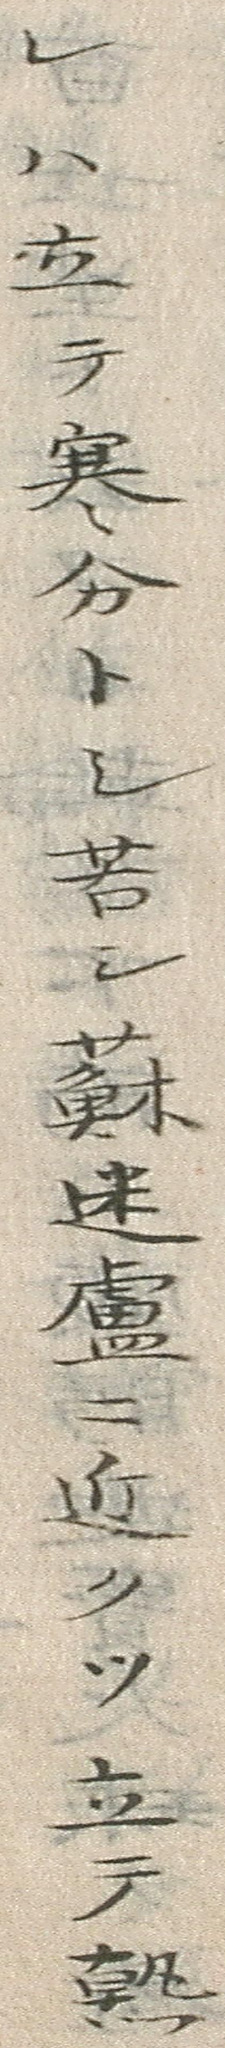レハ立テ寒分トシ若シ蘇迷慮ニ近クツ立テ熱
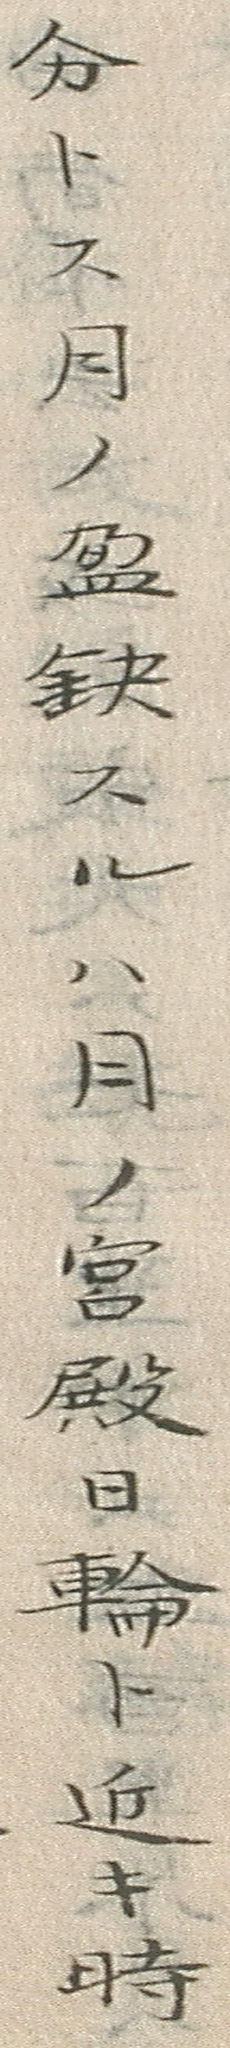分トス月ノ盈鈌スルハ月ノ宮殿日輪ト近キ時
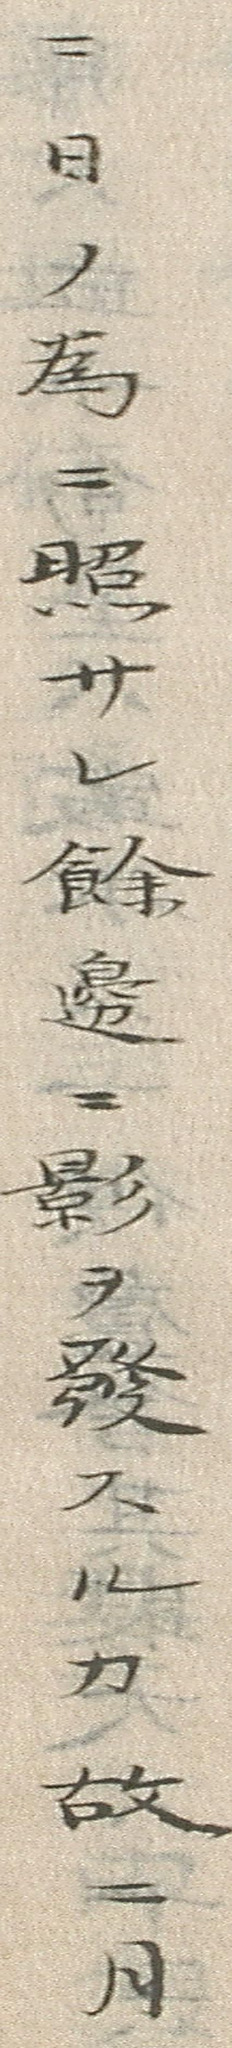ニ日ノ為ニ照サレ余辺ニ影ヲ発スルカ故ニ月
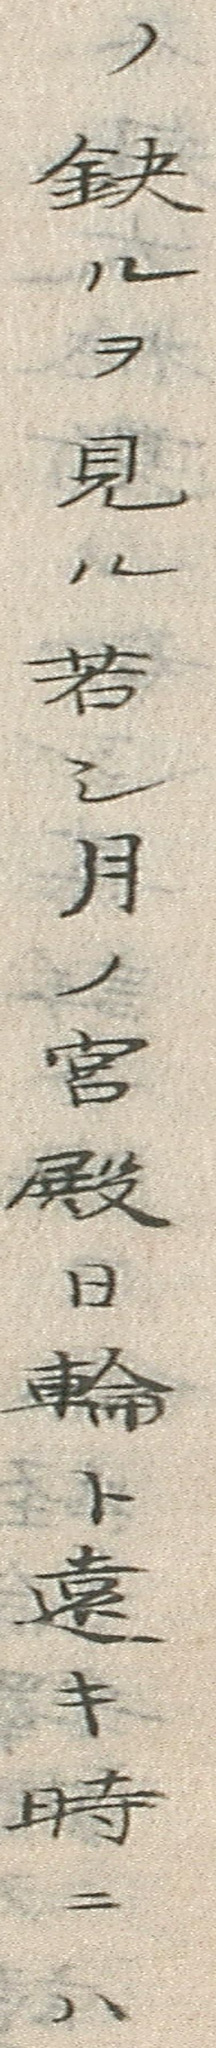ノ鈌ルヲ見ル若シ月ノ宮殿日輪ト遠キ時ニハ
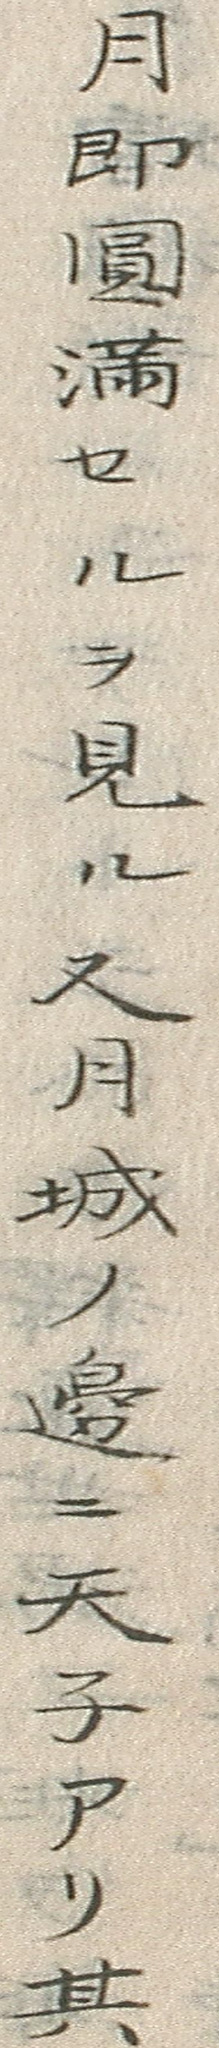月即円満セルヲ見ル又月城ノ辺ニ天子アリ其
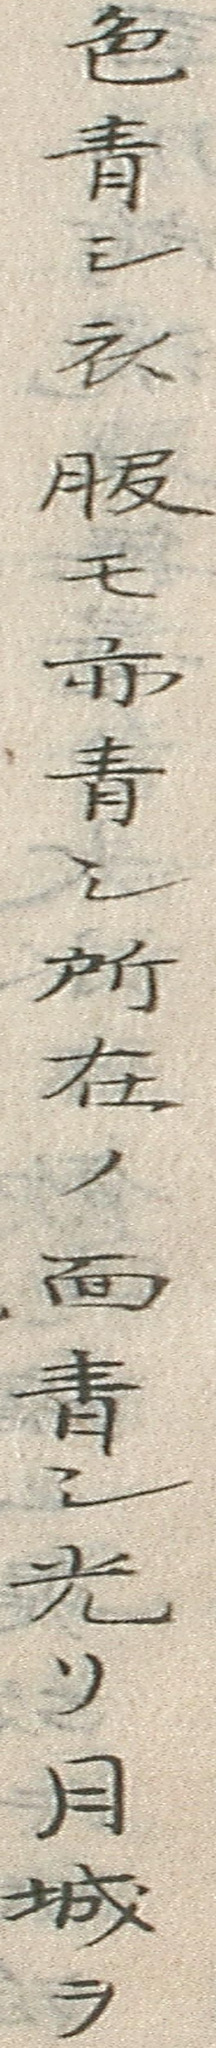色青シ衣服モ亦青シ所在ノ面青シ光リ月城ヲ
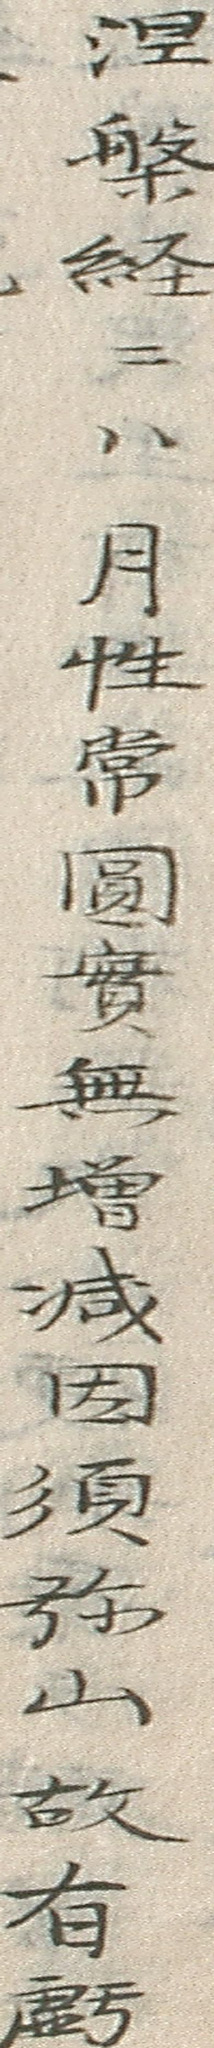涅槃経ニハ月性常円実無増減因須弥山故有虧
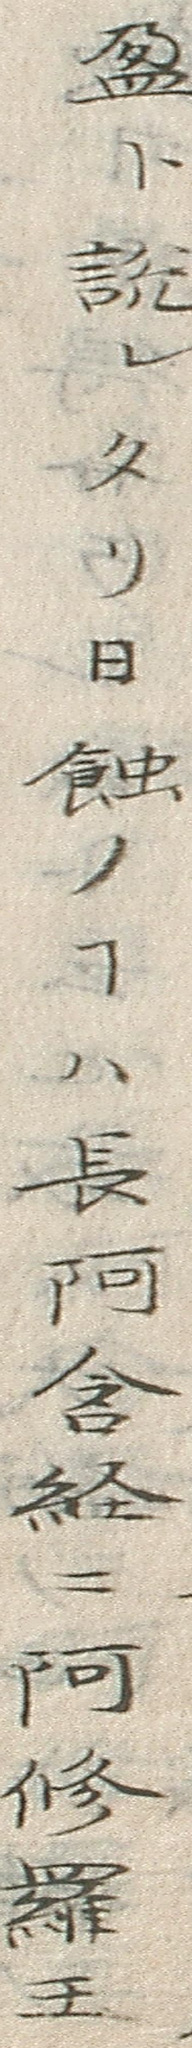盈ト説レタリ日蝕ノコトハ長阿含経ニ阿修羅王
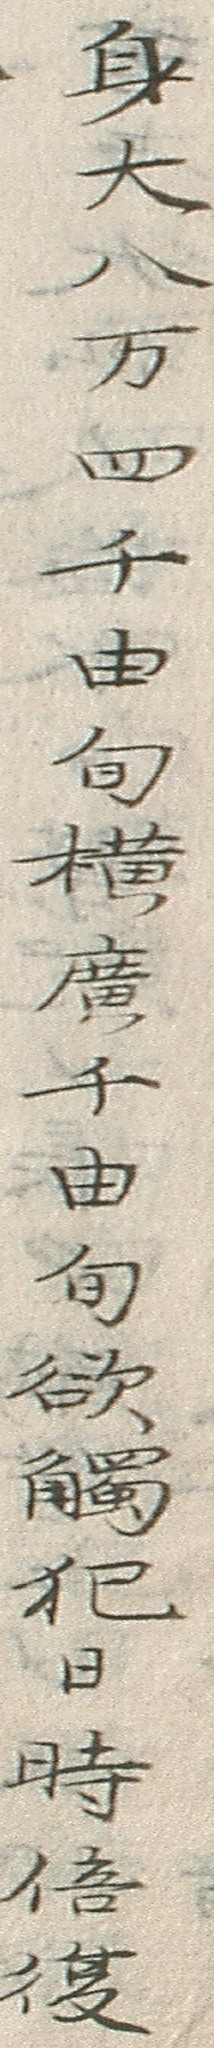身大八万四千由旬横広千由旬欲觸犯日時倍復
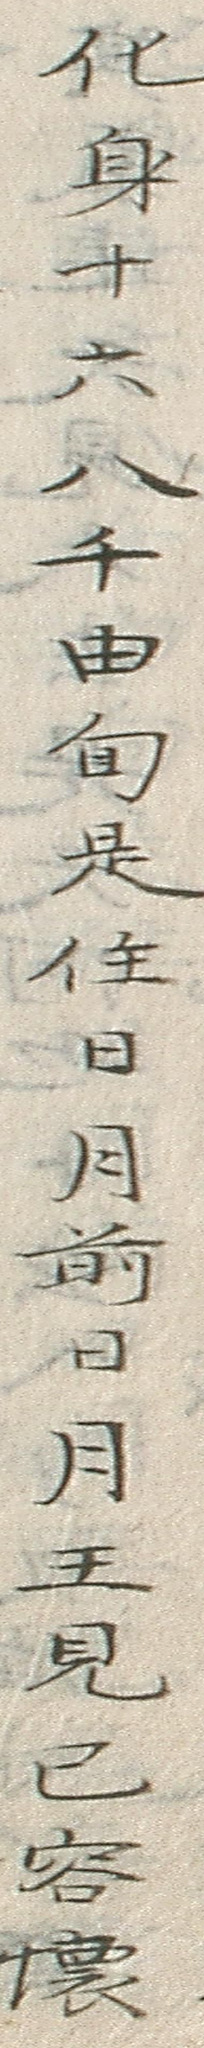化身十六八千由旬是住日月前日月王見己容懐
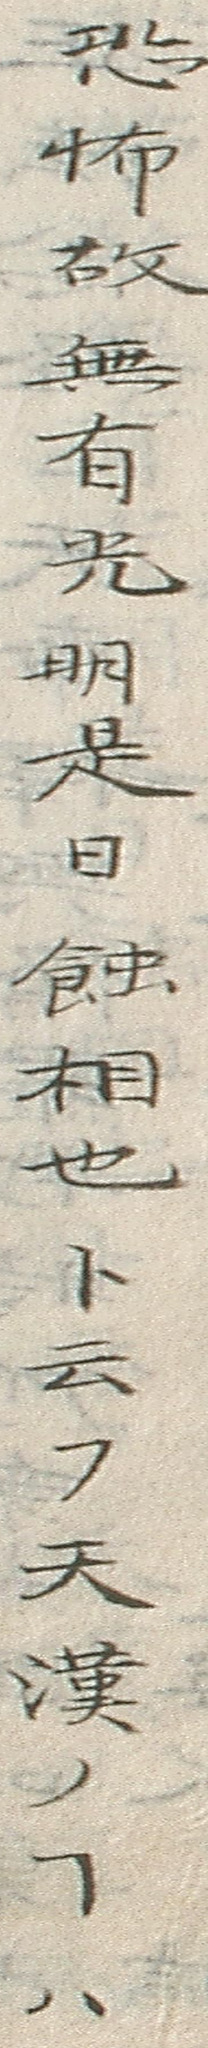恐怖故無有光明是日蝕相也ト云フ天漢ノコトハ

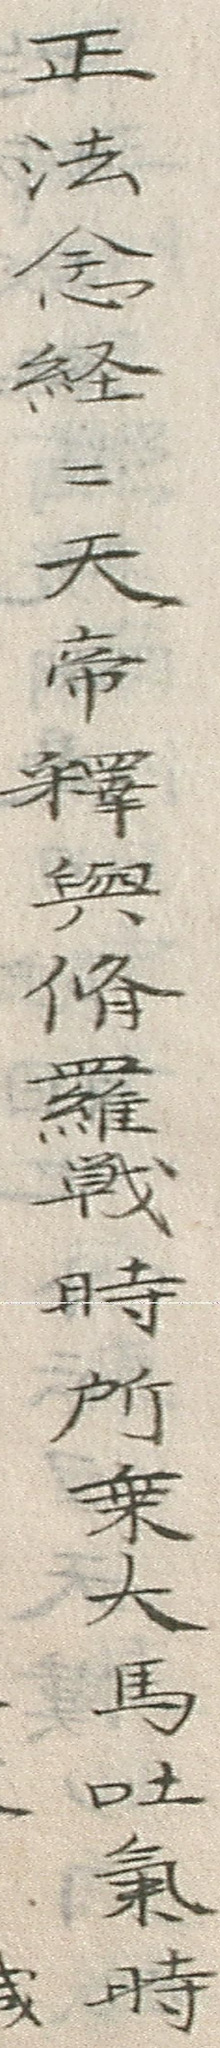正法念経ニ天帝釈与修羅戦時所乗大馬吐気時
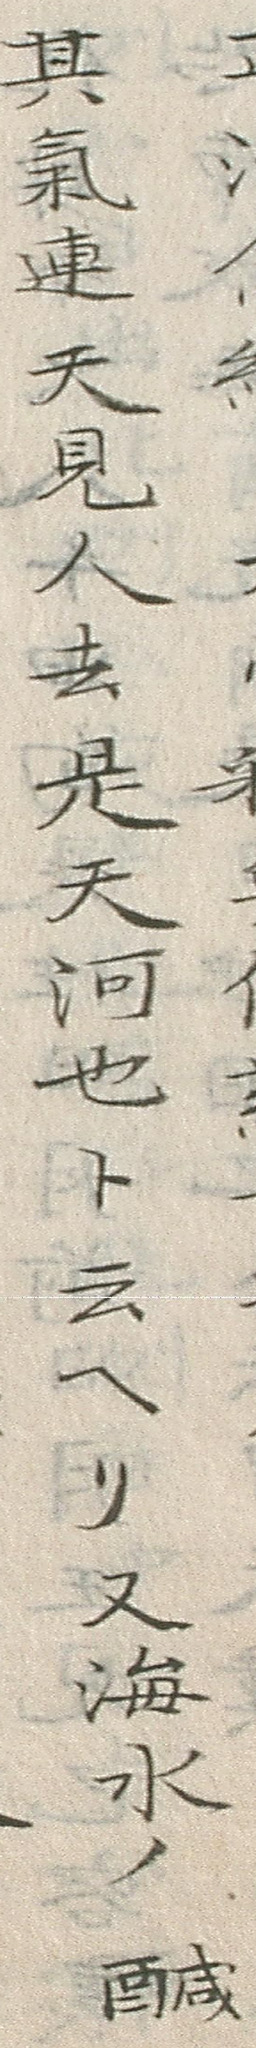其気連天見人去是天河也ト云ヘリ又海水ノ醎
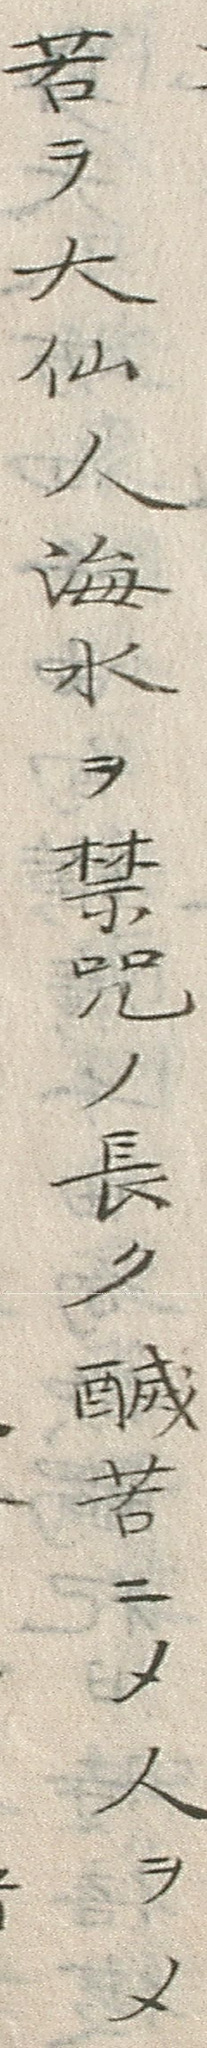苦ヲ大仙人海水ヲ禁咒ノ長ク醎苦ニシテ人ヲシテ
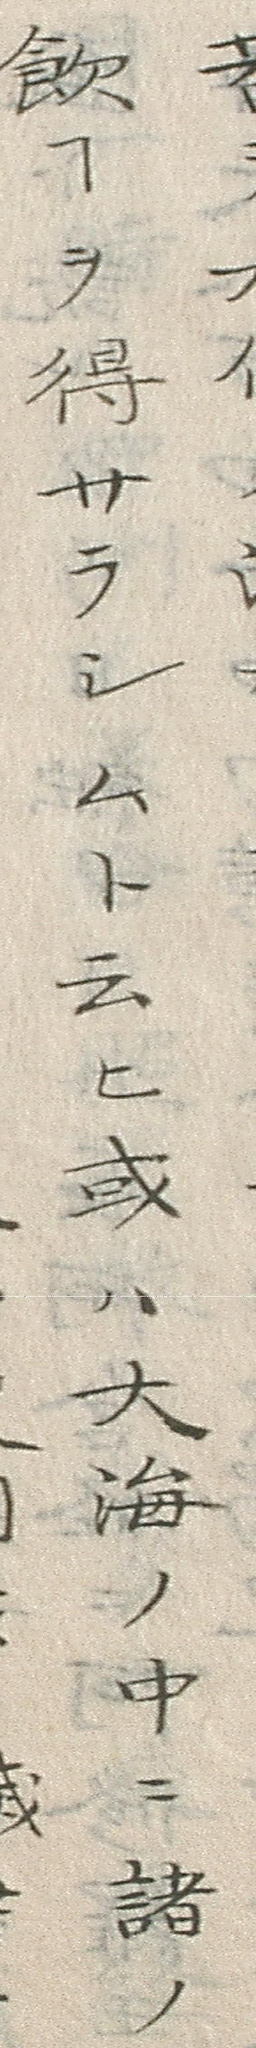飲コト得サラシムト云ヒ或ハ大海ノ中ニ諸ノ
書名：天學略名目羽翼　全
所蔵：東京大学地震研究所図書室 Earthquake Research Institute Library, The University of Tokyo, JAPAN
